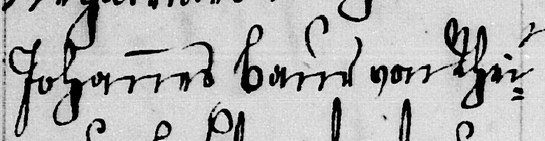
Johannes Baur von Rhei¬
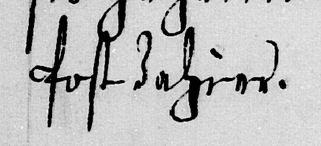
Post dahier,
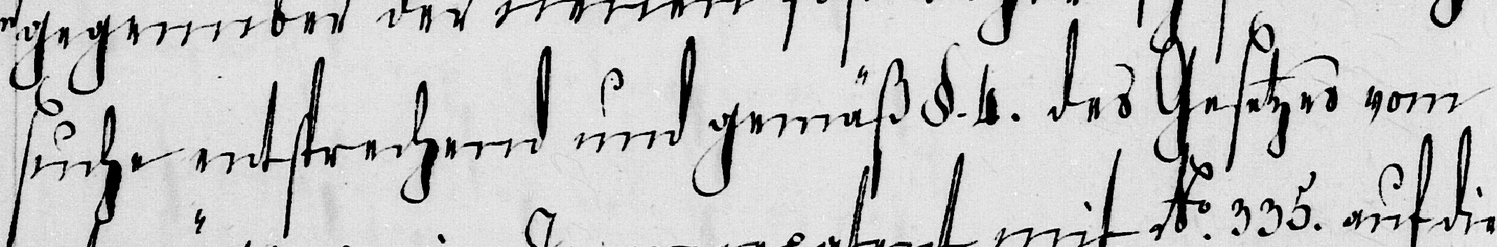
suche entsprechend und gemäß §. 4. des Gesetzes vom
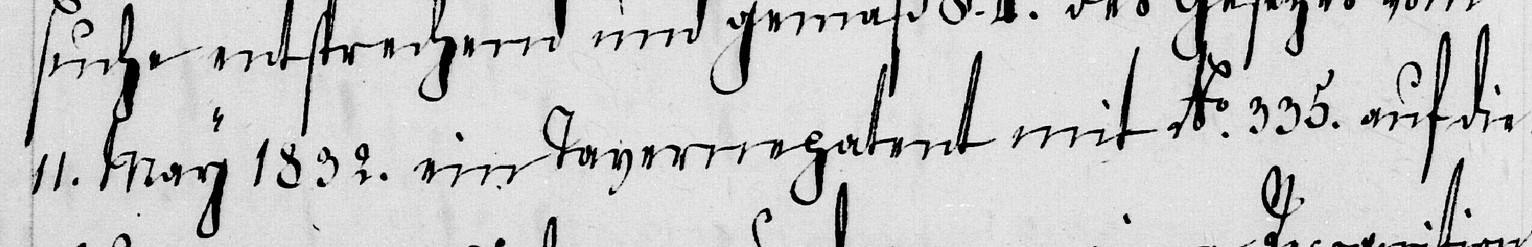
11. May 1832. ein Tavernepatent mit No. 335. auf die
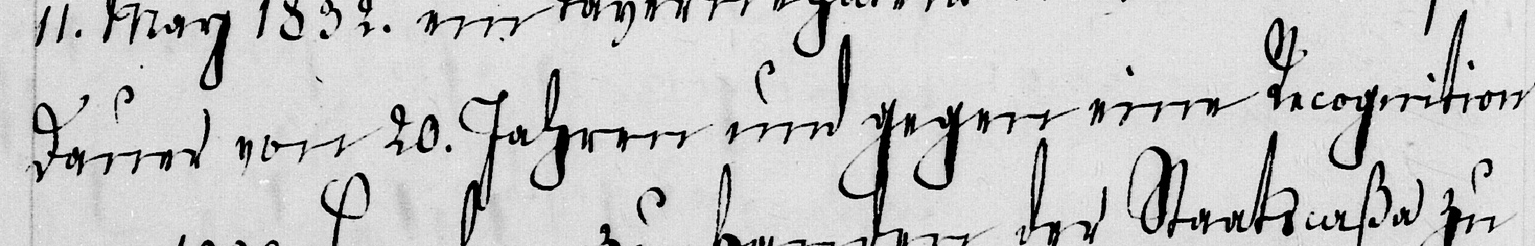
Dauer von 20. Jahren und gegen eine Recognition
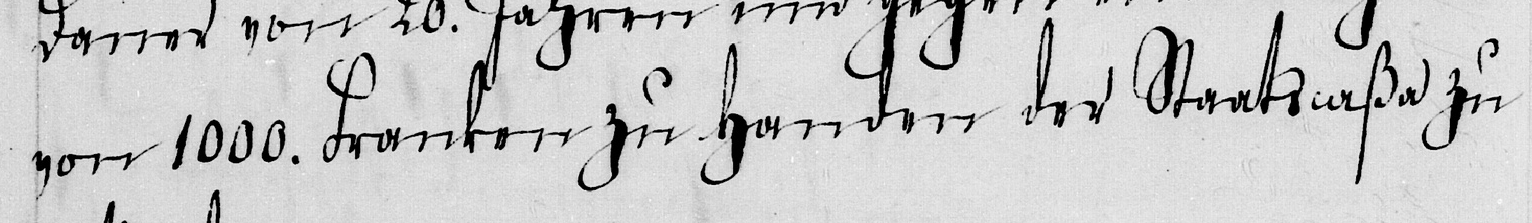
von 1000. Franken zu Handen der Staatscaßa zu
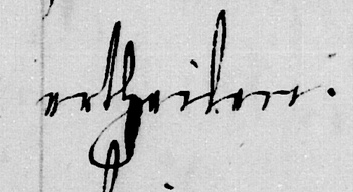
ertheilen.
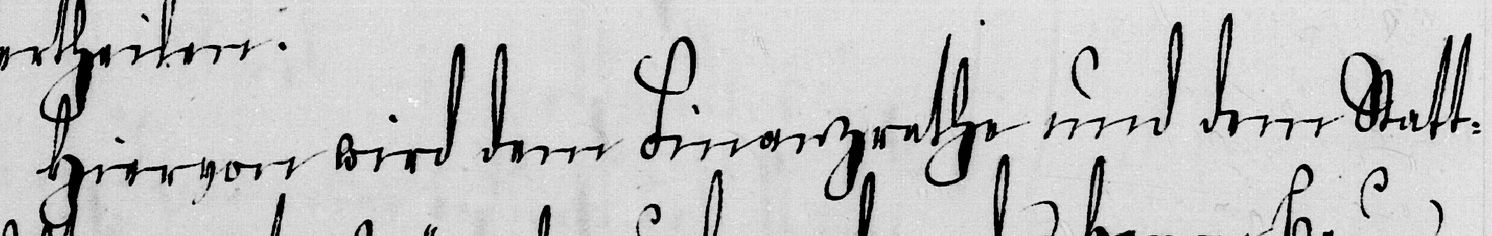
Hiervon wird dem Finanzrathe und dem Statt¬
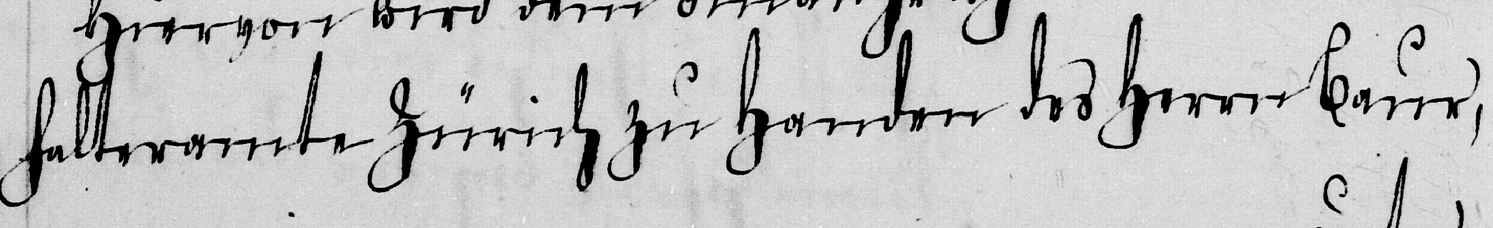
halteramte Zürich zu Handen des Herrn Baur,
